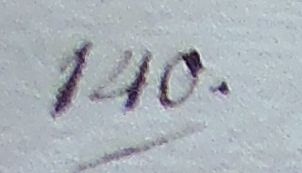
140.
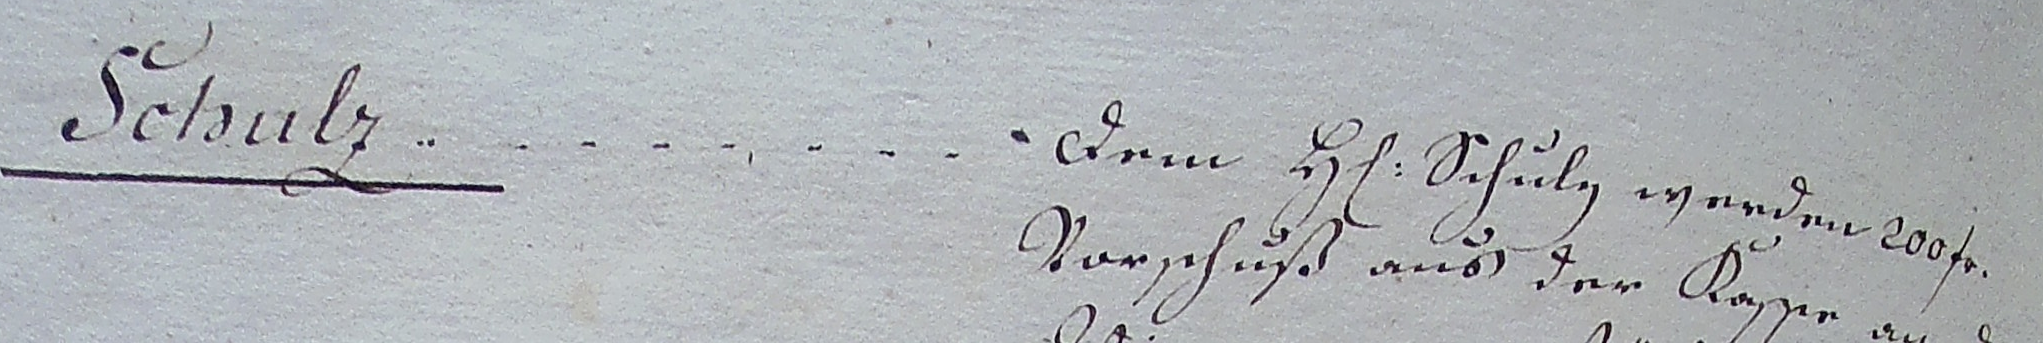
Schulz .. .. .. .. .. .. .. .. Dem HE: Schulz werden 200fr.
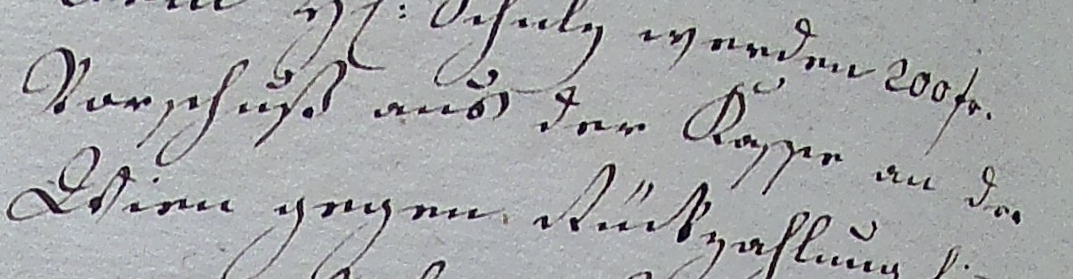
Vorschuß aus der Kasse an der
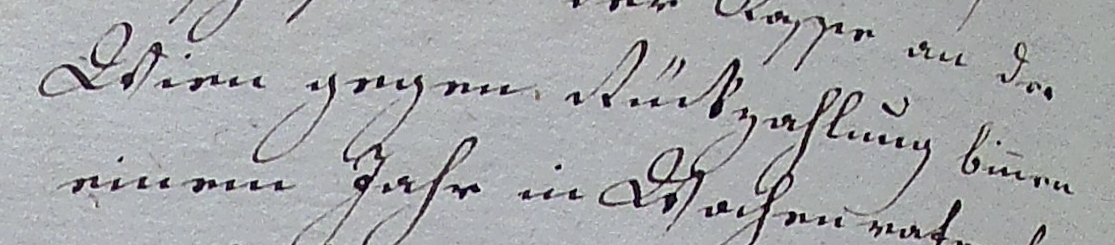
Wien gegen Rückzahlung bin̅en
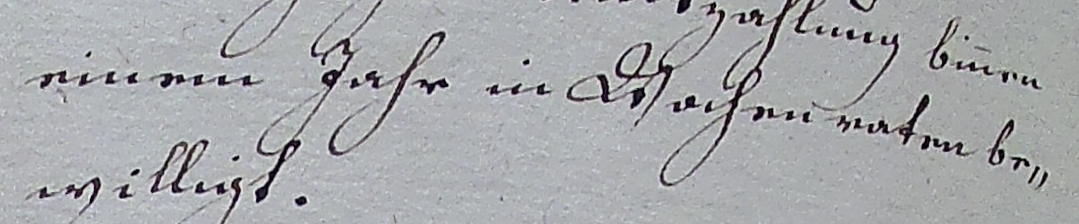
einem Jahr in Wochenraten be¬
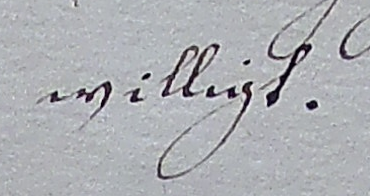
willigt.
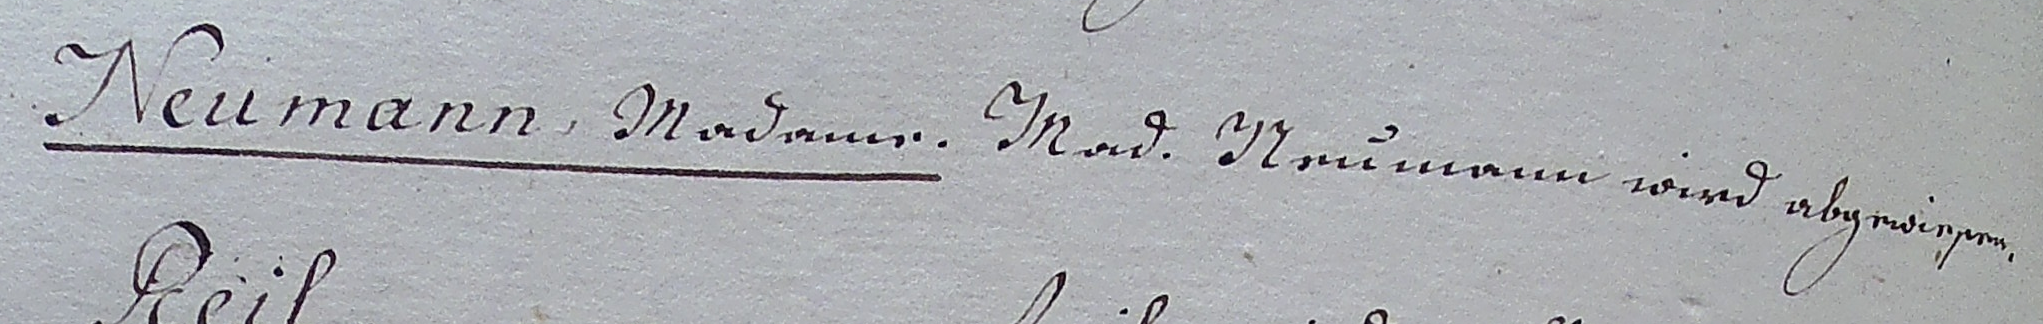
Neumann, Madame. Mad. Neumann wird abgewiesen.
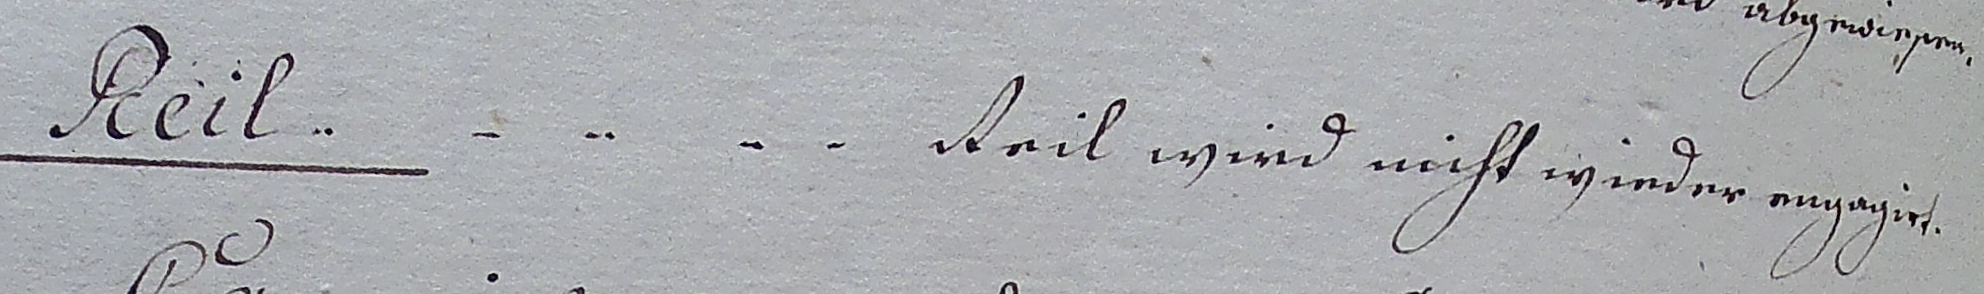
Reil .. .. .. .. .. Reil wird nicht wieder engagirt.
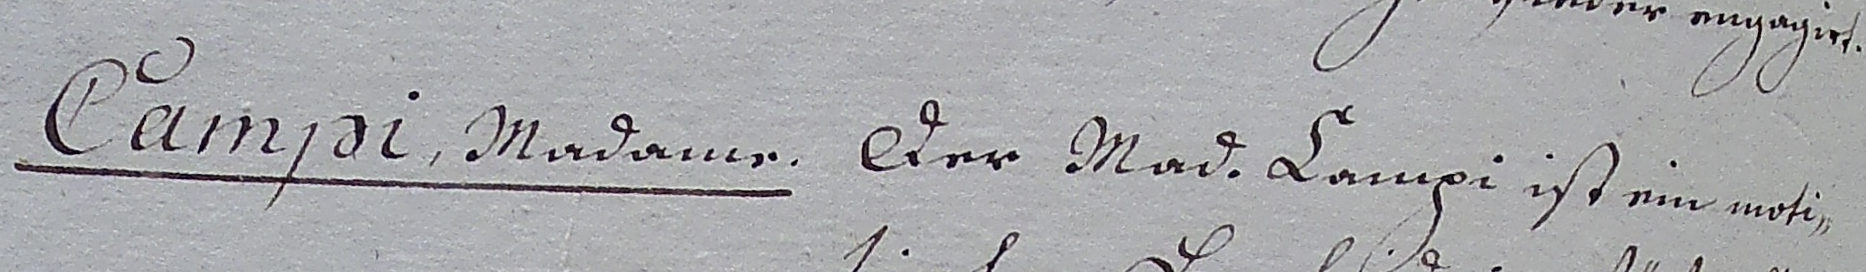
Campi, Madame. Der Mad. Campi ist ein moti¬
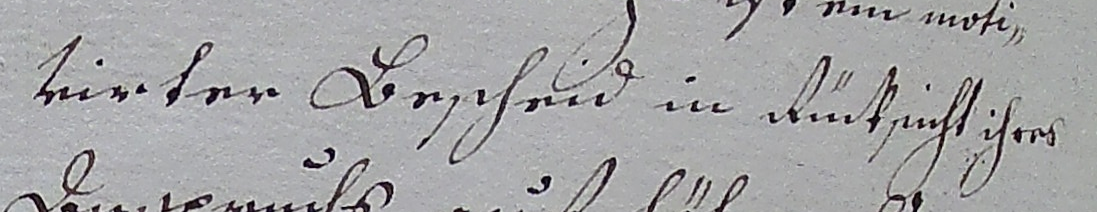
virter Bescheid m Rüksicht ihres
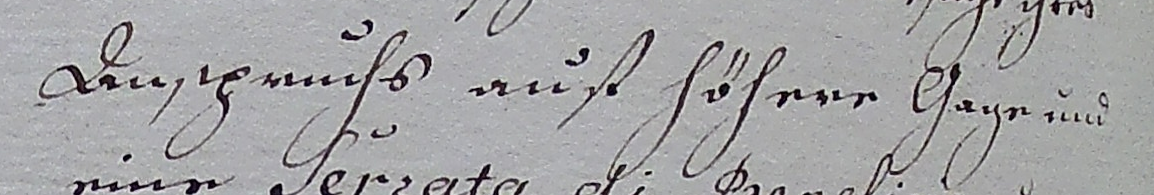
Anspruchs auf höhere Gage und
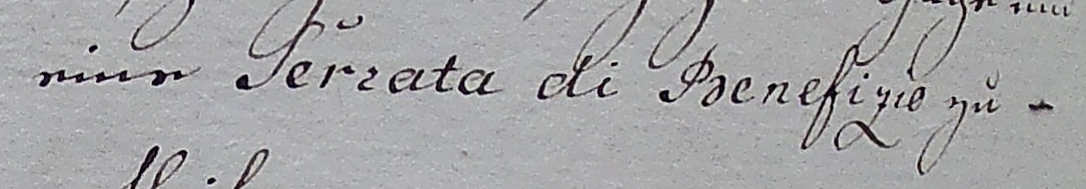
eine Serrata di Benefizie zu -
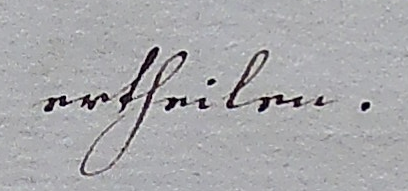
ertheilen.
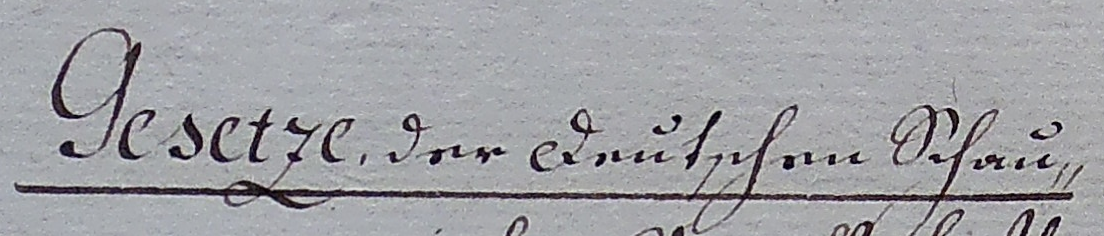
Gesetze, der Deutschen Schau¬
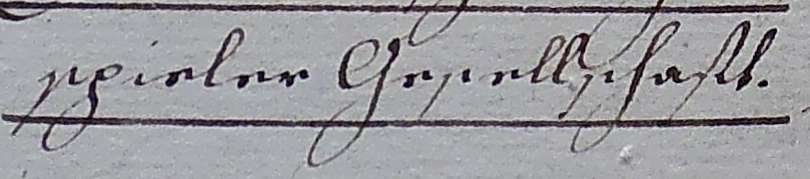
spieler Gesellschaft.
